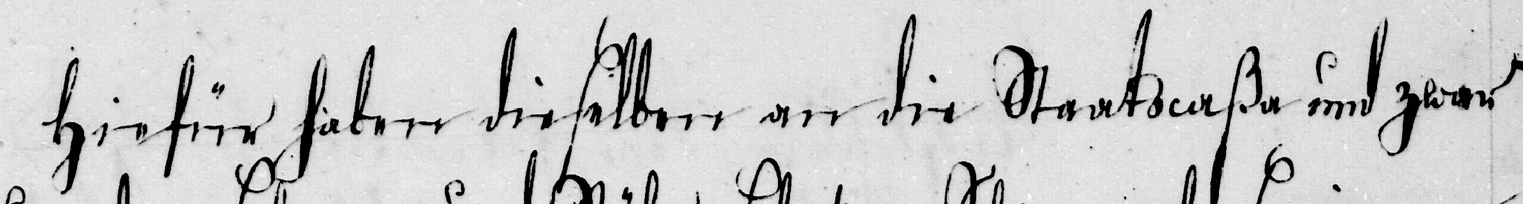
Hiefür haben dieselben an die Staatscaßa und zwar
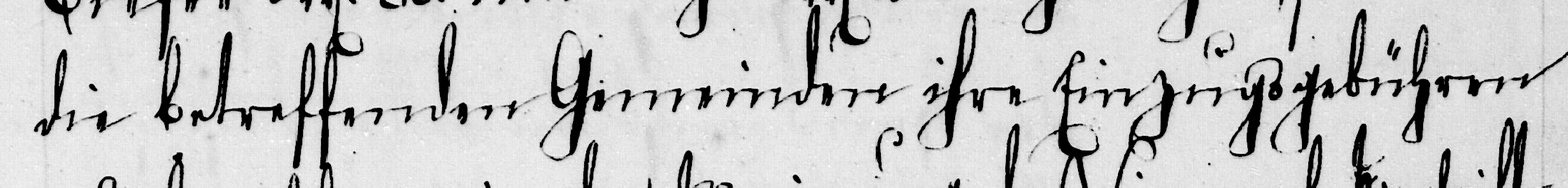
die betreffende Gemeinden ihre Einzugsgebühren
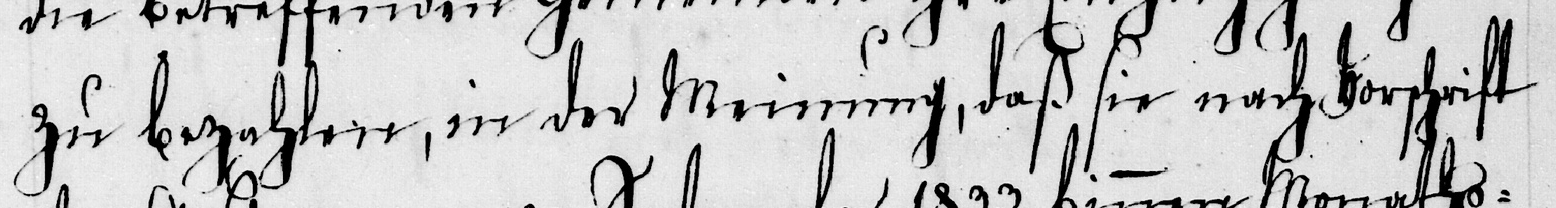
zu bezahlen, in der Meinung, daß sie nach Vorschrift
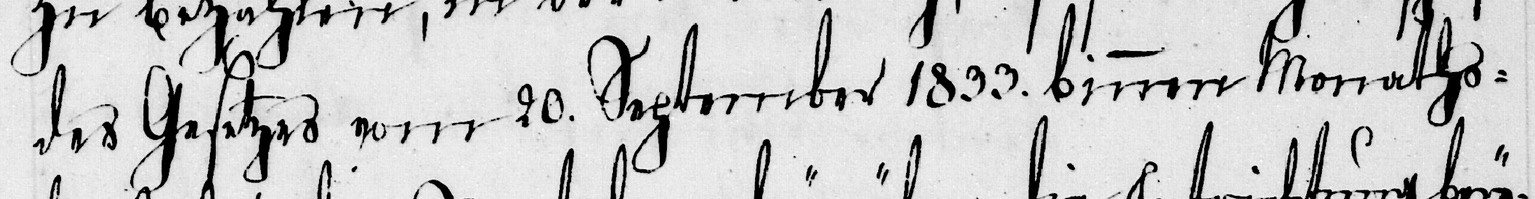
des Gesetzes vom 20. September 1833. binnen Monaths¬
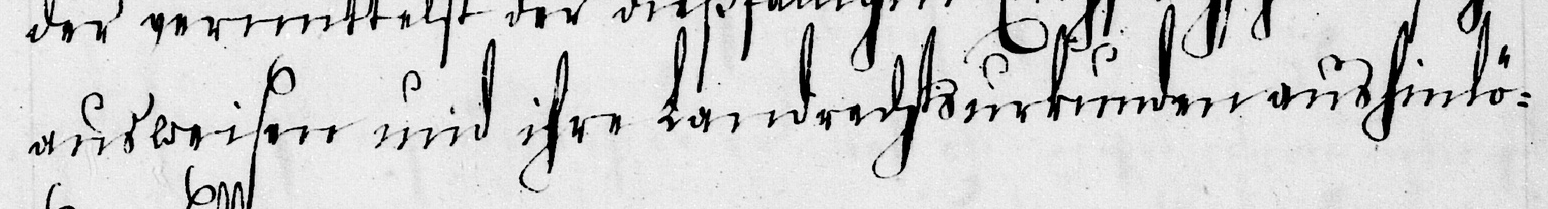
ausweisen und ihre Landrechtsurkunden aushinlö¬
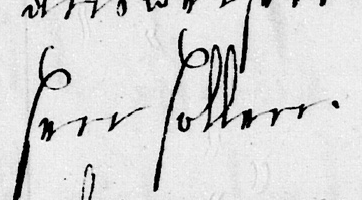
sen sollen.
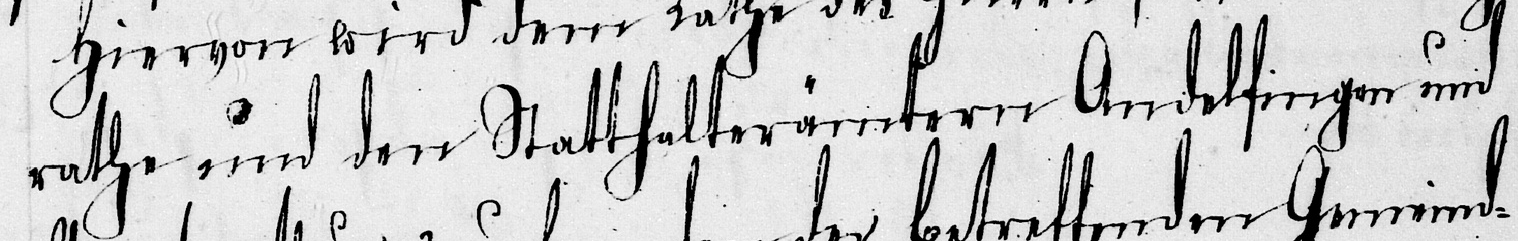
rathe und den Statthalterämtern Andelfingen und
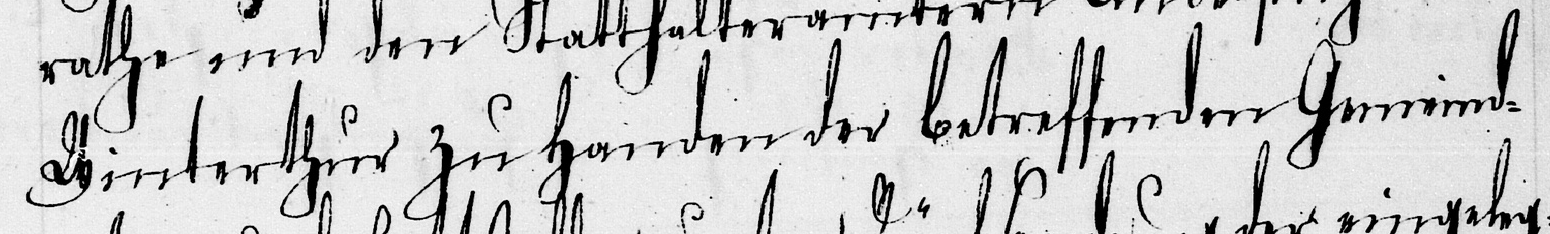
Winterthur zu Handen der betreffenden Gemeind¬
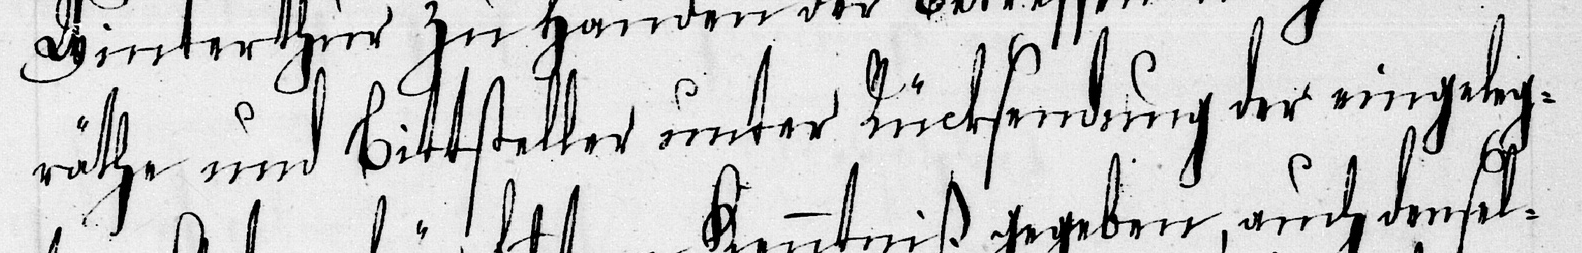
räthe und Bittsteller unter Rücksendung der eingeleg¬
